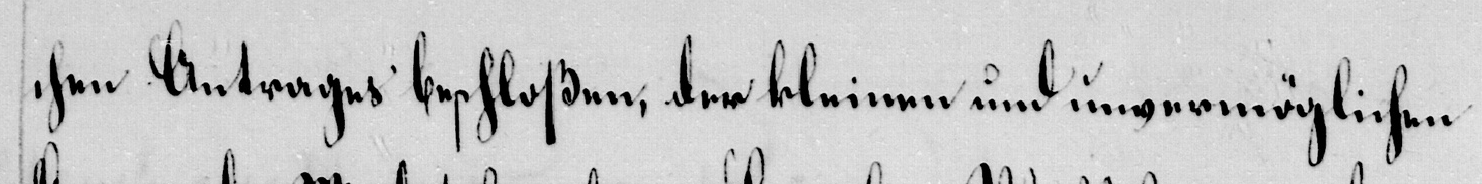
chen Antrages beschloßen, der kleinen und unvermöglichen
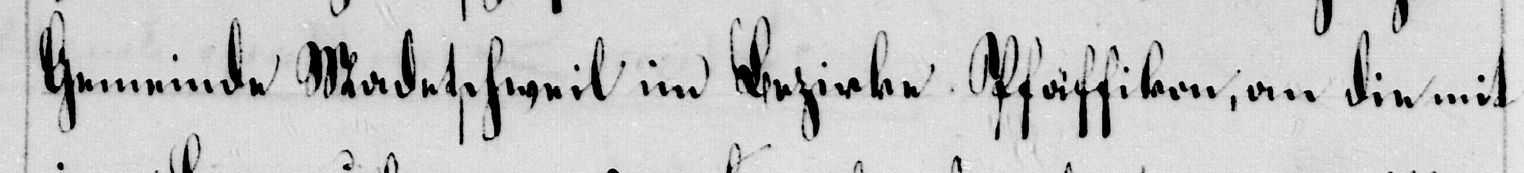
Gemeinde Madetschweil im Bezirke Pfäffikon, an die mit
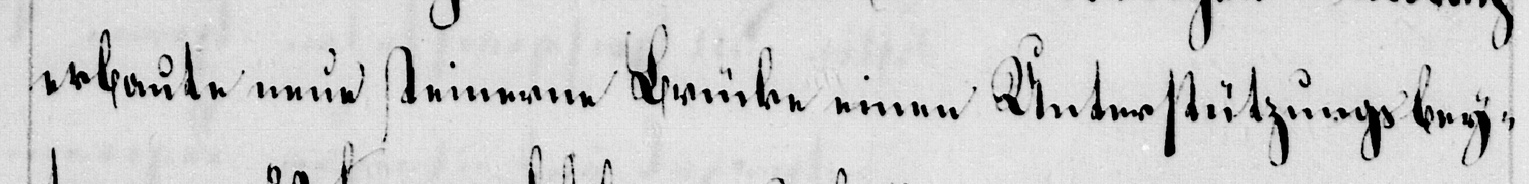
erbaute neue steinerne Brücke einen Unterstützungsbey¬
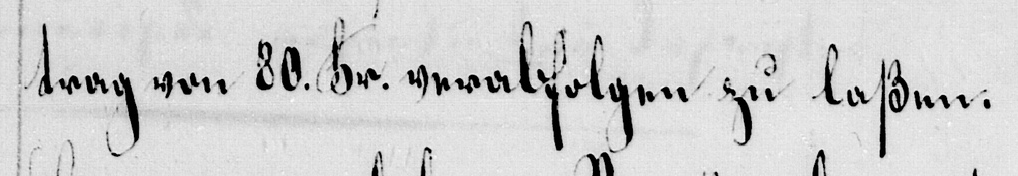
trag von 80. Fr. verabfolgen zu laßen.
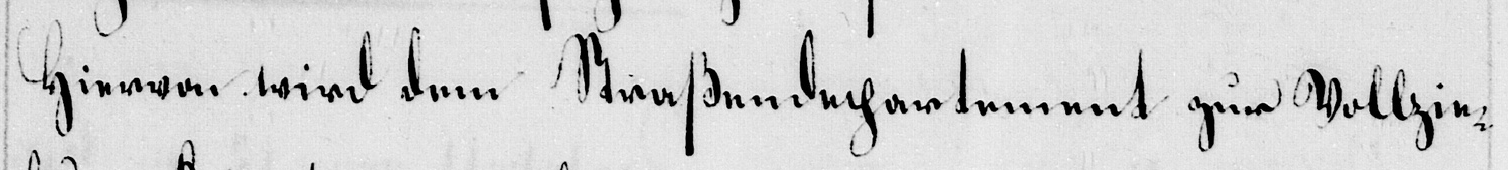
Hiervon wird dem Staßendepartement zur Vollzie¬
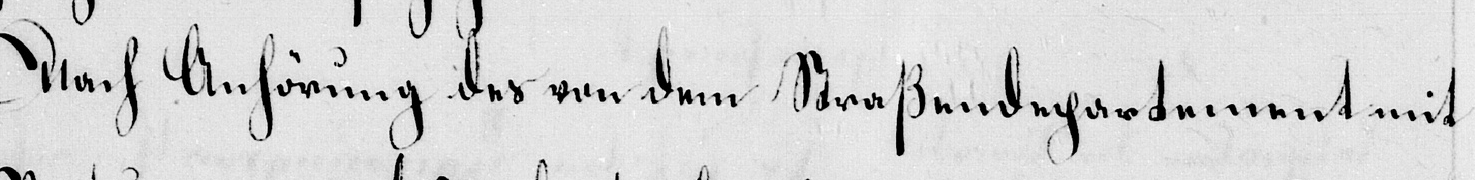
Nach Anhörung des von dem Straßendepartement mit
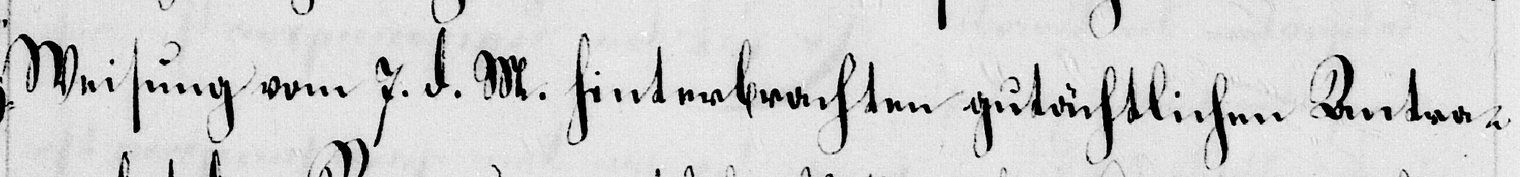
Weisung vom 7. d. M. hinterbrachten gutächtlichen Antra¬
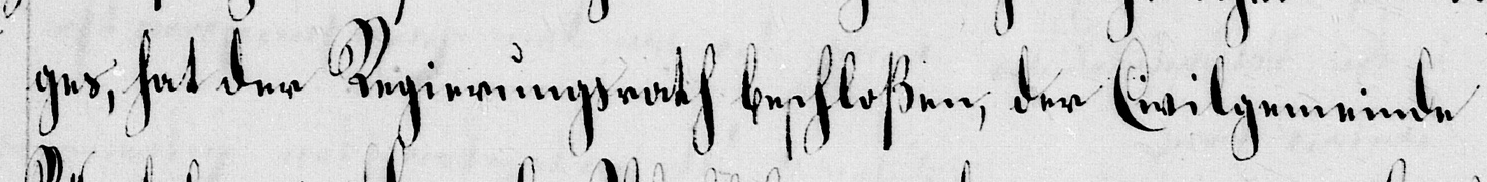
ges, hat der Regierungsrath beschloßen, der Civilgemeinde
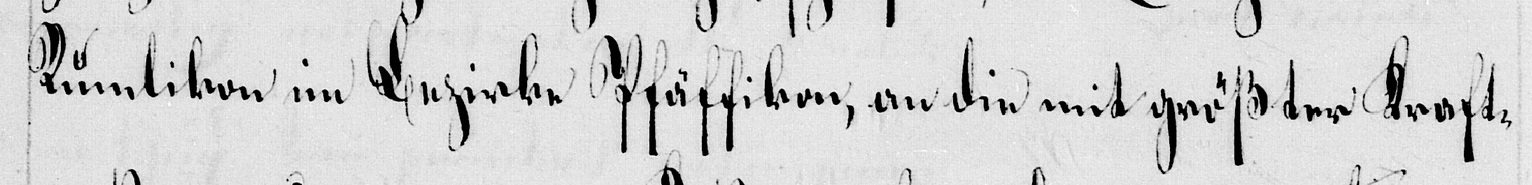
Rümlikon im Bezirke Pfäffikon, an die mit größter Kraft¬
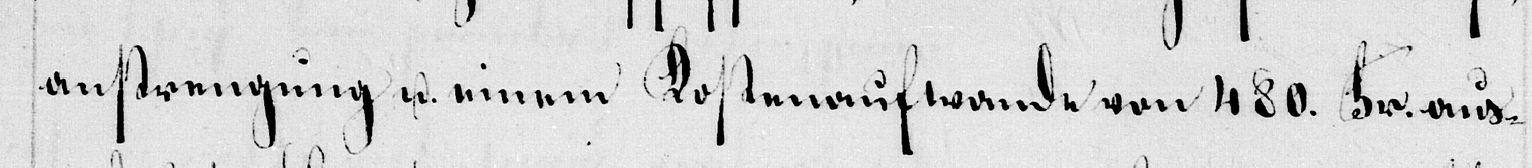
anstrengung u. einem Kostenaufwande von 430. Fr. aus¬
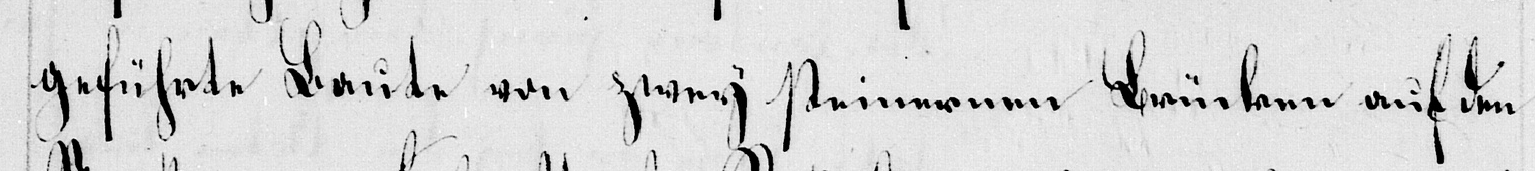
geführte Baute von zwey steinernen Brücken auf den
